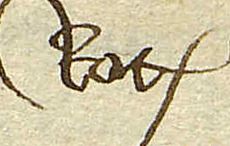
Rot*
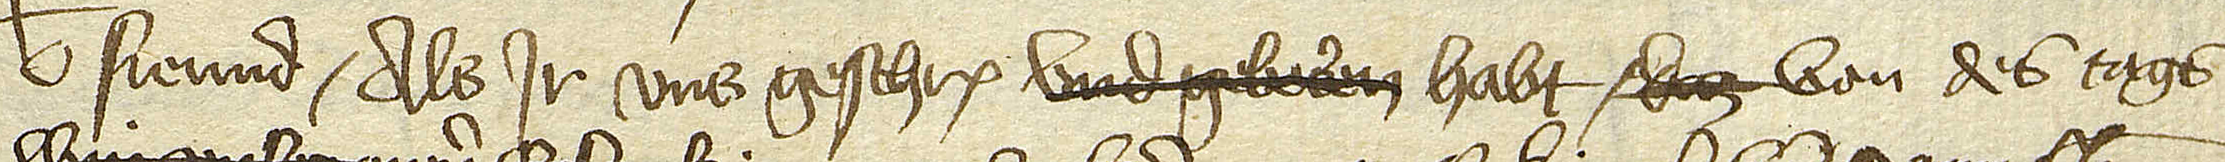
L* freund / Als Ir vns geſchr* vnd gebeten habt / daʒ von des tags
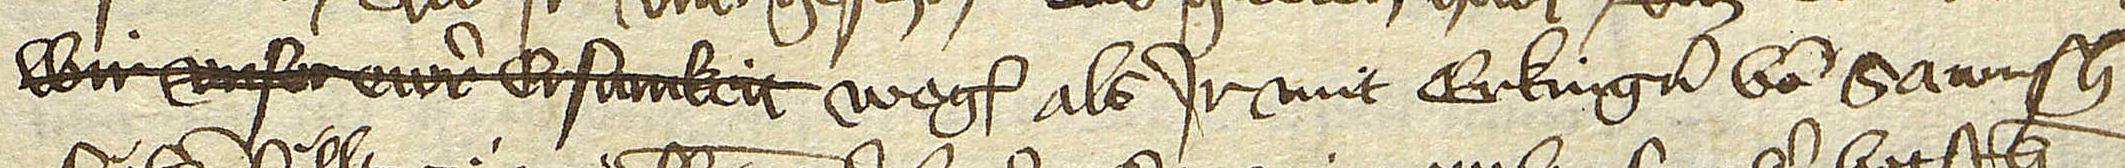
wir vnſer ewr* Erſamkeit weg* als Ir mit Erkingn* vo* Sawnſh*
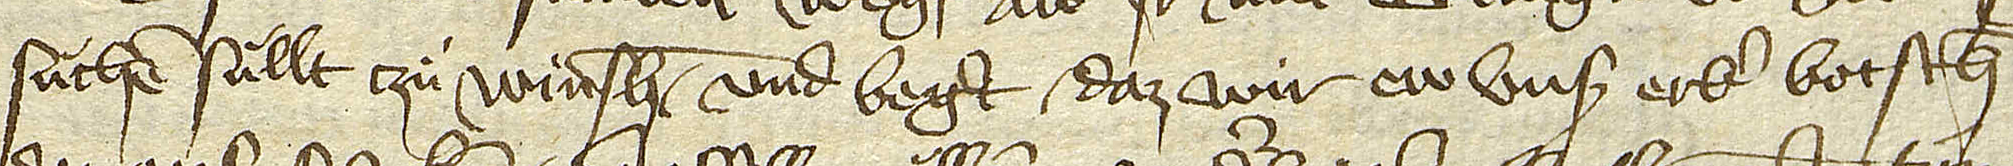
ſüche* ſüllt cʒü winſh* / vnd beg*t / daʒ wir ew vnſ* erb* botſch*
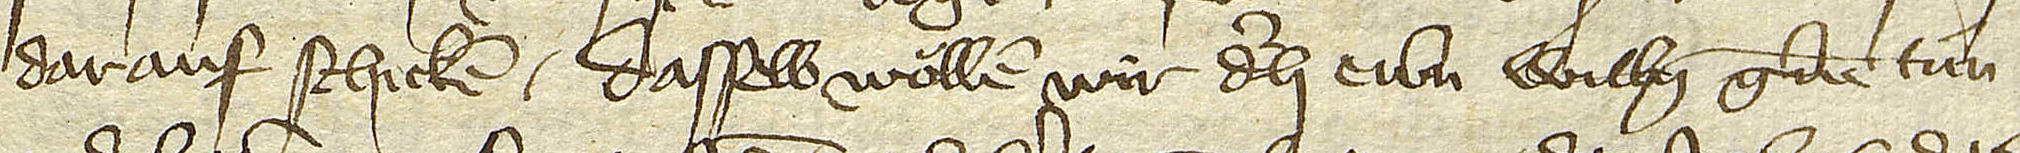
darauf ſchicke* / daſſelb wölle* wir d*h ew*n willn* g*ne tün
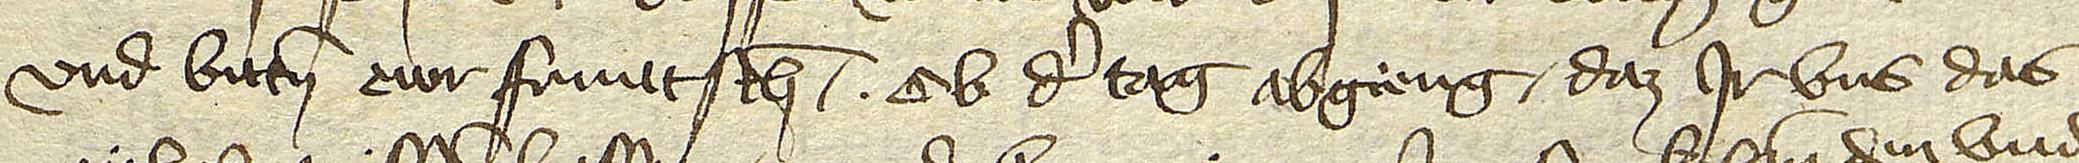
vnd bittn* ewr fruntſch* / . Ob d* tag abgieng / daʒ Ir vns das
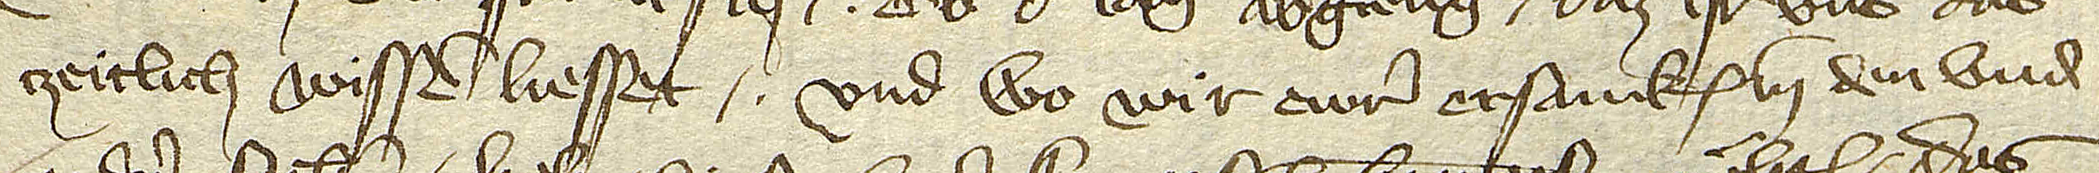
cʒeitlich wiſſe* lieſſet / . vnd wo wir ewr* erſamk* in* den vnd
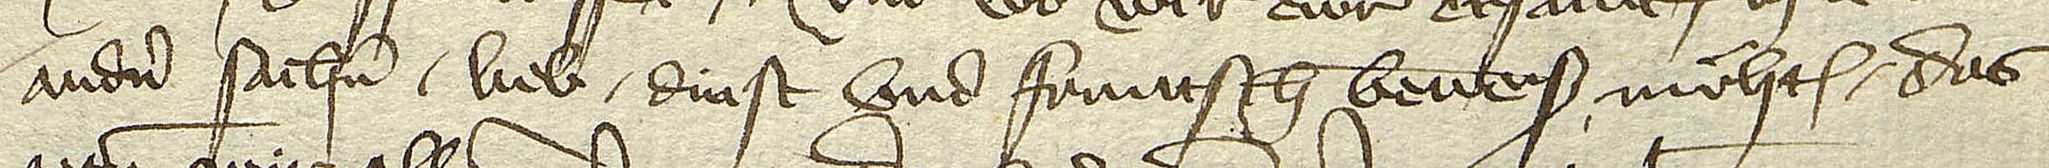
andn* ſachn* / lieb / dinſt vnd fruntſch* beweiſʒ* möht / Das
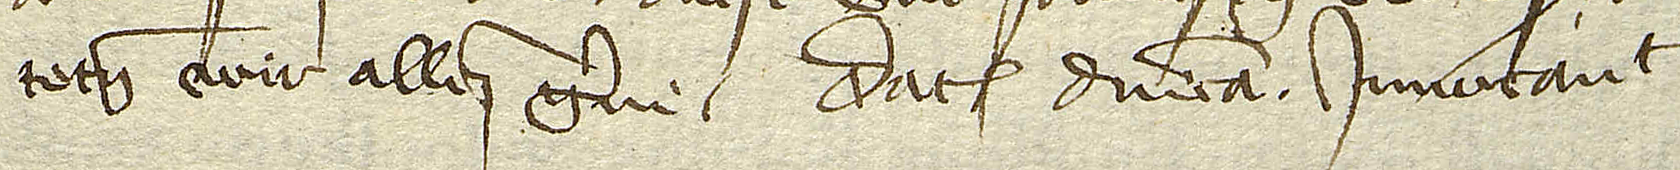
tetn* wir allcʒ* g*ne / Dat* dnica* . Inuocau*
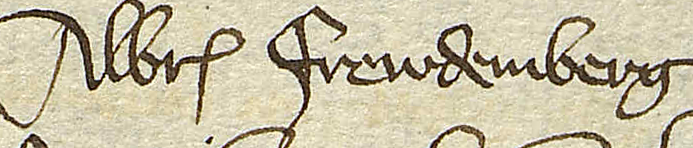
Albr* Frewdemberg*
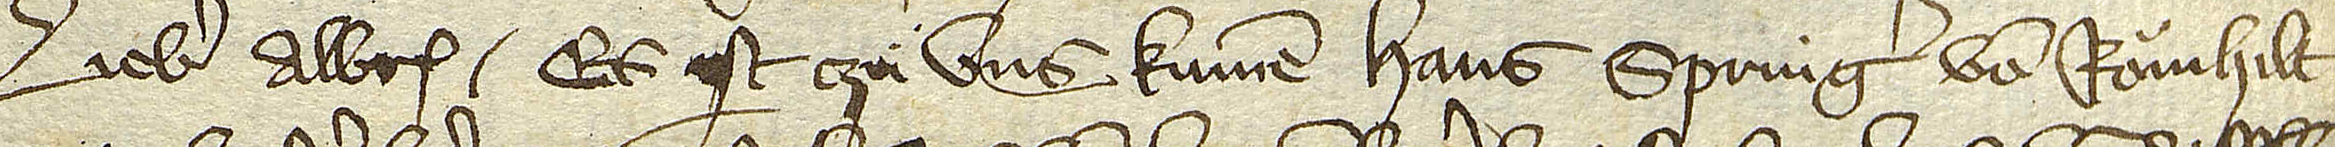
Lieb* Albr* / Es iſt cʒü vns kume* Hans Spring* vo* Römhilt
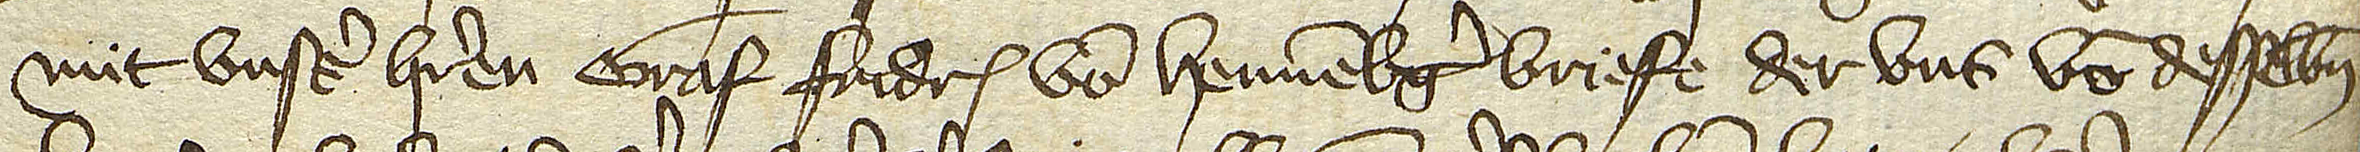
mit vnſs* hr*en Graf fridr* vo* Henne*bg* briefe der vns vo* deſſelbn*
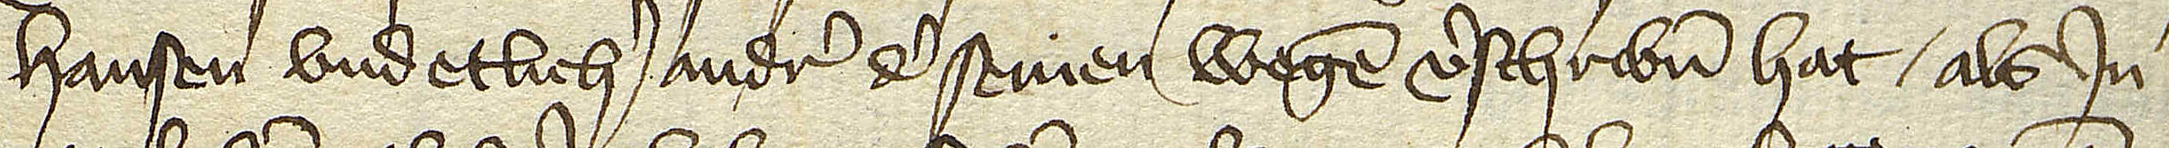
Hanſen vnd etlich* andr* d* ſeinen wege* v*ſchribn* hat / als In
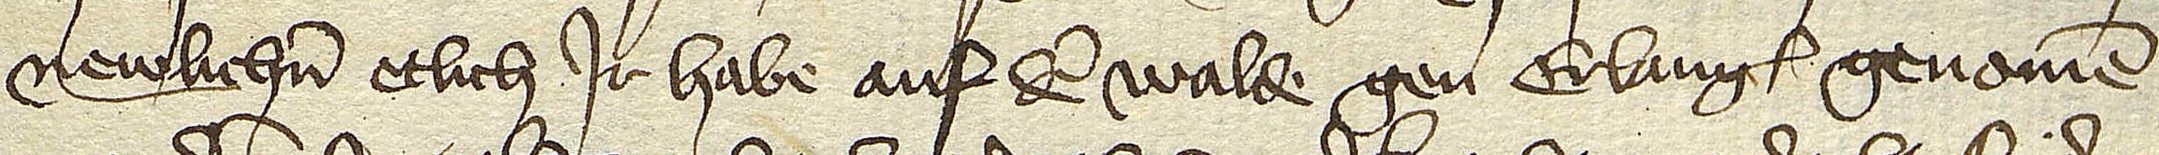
newlichn* etlich Ir habe auf d* walde gen Erlang* genome*
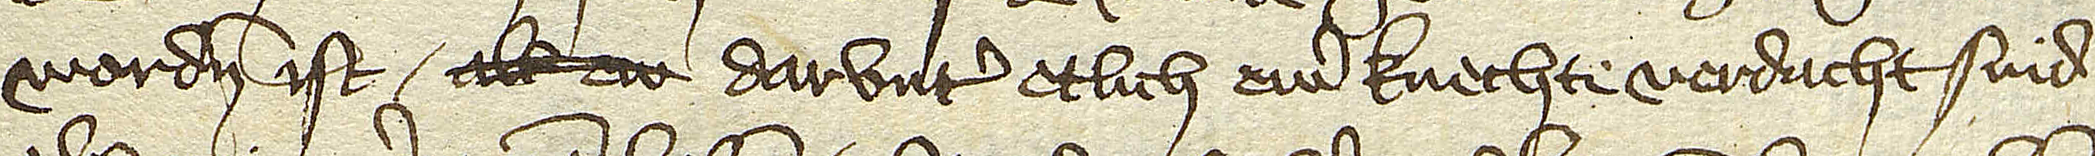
wordn* iſt / als ew darvnt* etlich ew* knechte verdacht ſind
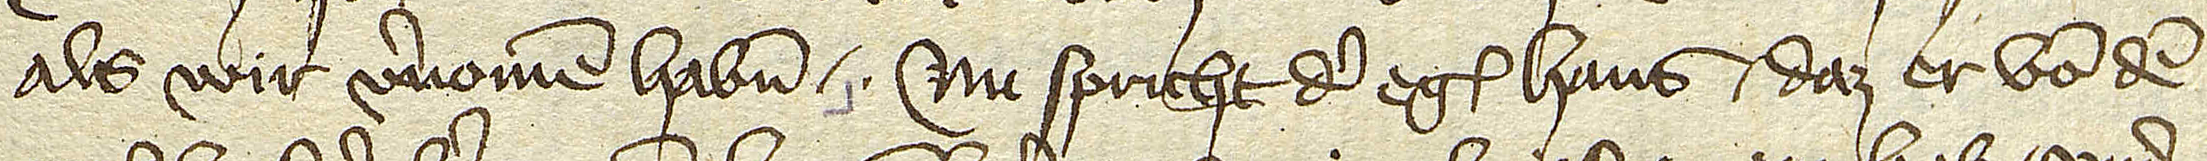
als wir v*nome* habn* / . Nu ſpricht d* eg* hans / daʒ er vo* d*
